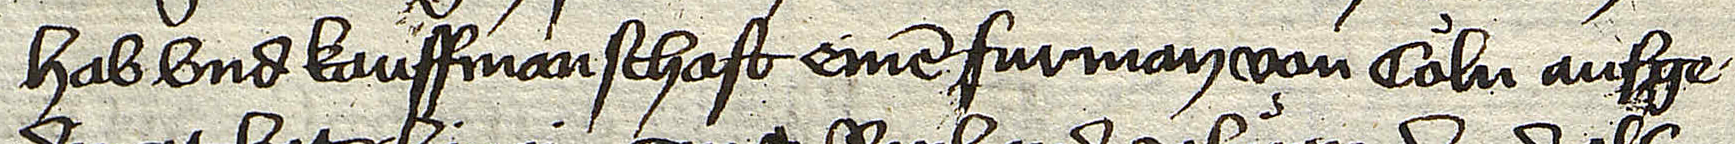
hab vnd kauffman ſchaft eine* furman von Cöln aufge -
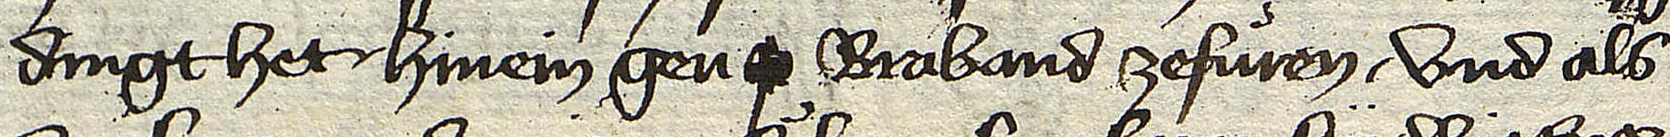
dingt het / hinein gen I Braband cʒefüren / Vnd als
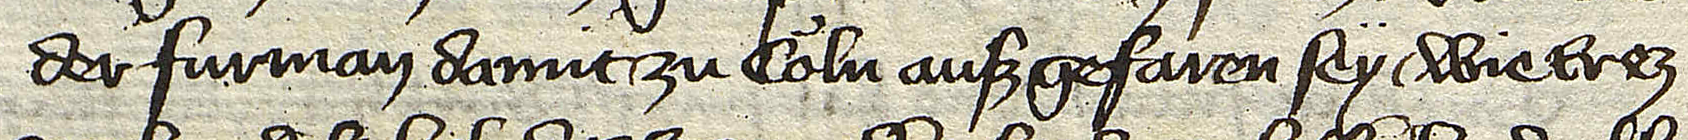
der furman damit cʒu Cöln auſʒgefaren ſey / wie Er eʒ
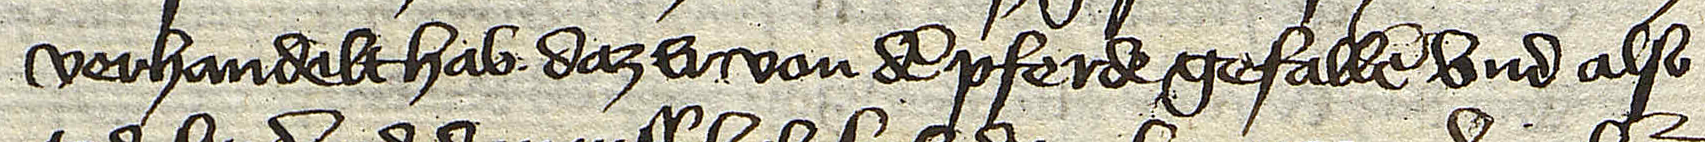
verhandelt hab . daʒ Er von d* pferde gefalle* vnd alſo
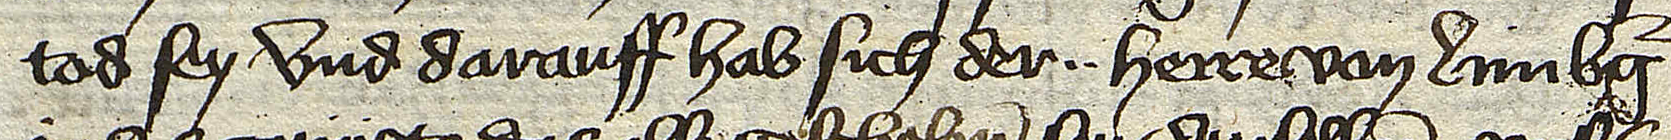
tod ſey / Vnd darauff hab ſich der ~ herre von Limbg*
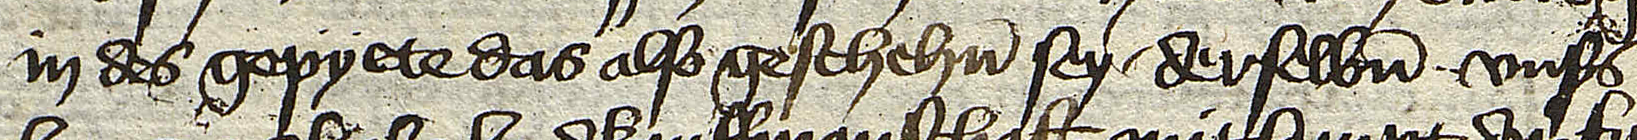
in des gepyete das alſo geſcheh*n ſey / derſelb*n . vnſ*s
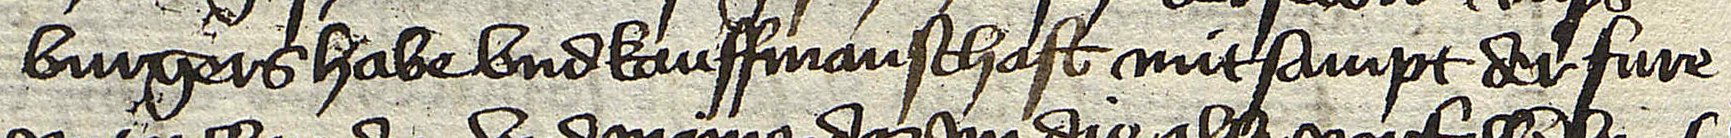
burgers habe vnd kauffmanſchaft mitſampt der fure
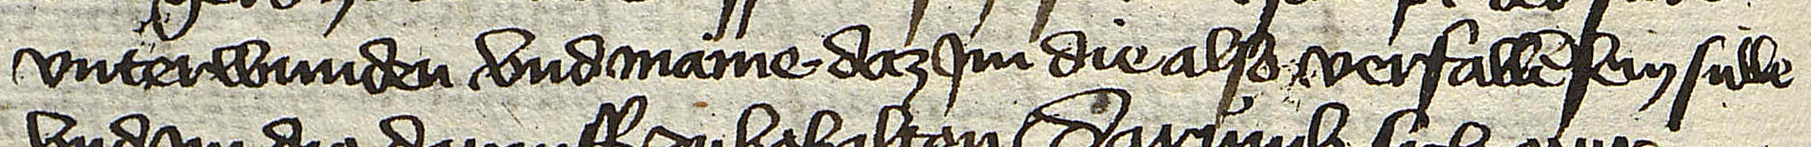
vnterwunden / vnd maine . daʒ Im die alſo verfalle* ſein ſülle
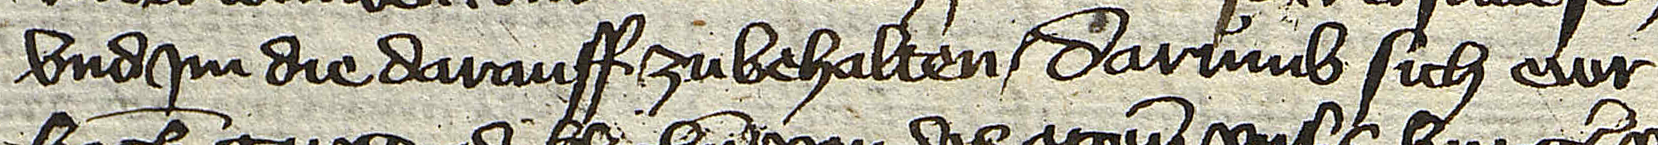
vnd Im die darauff cʒu behalten / darümb ſich ewr
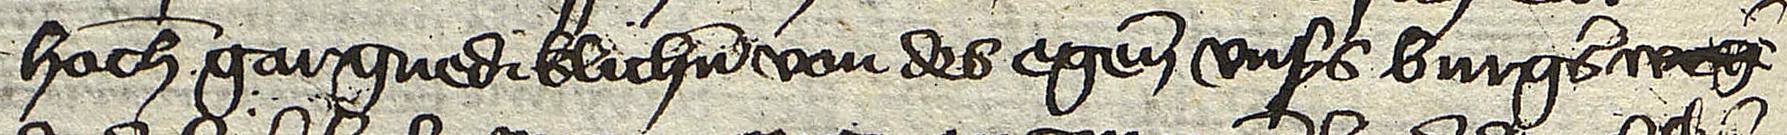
hoch* gar gnediklich*n von des egen* vnſ*s burg*s weg*
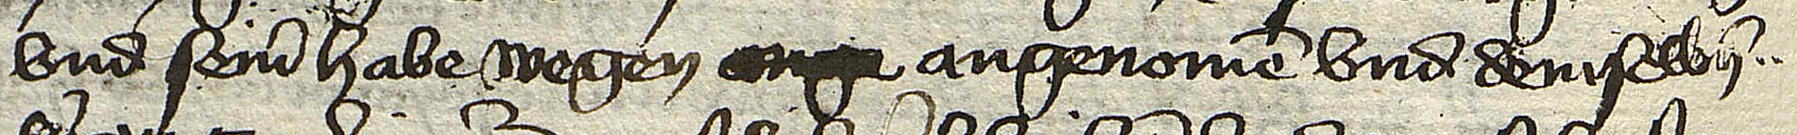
vnd ſein* habe wegen ange angenome* vnd demſelbn* ~
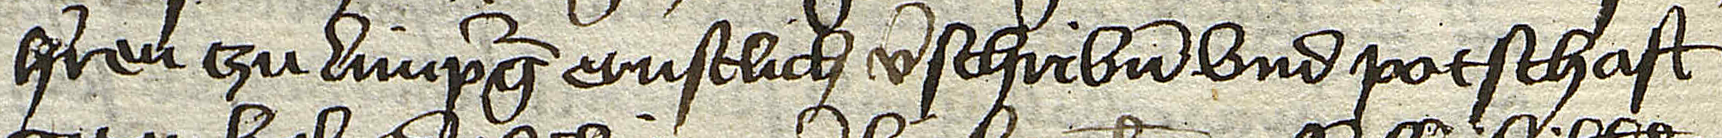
hren* cʒu limpg* ernſtlich v*ſchribn* vnd potſchaft
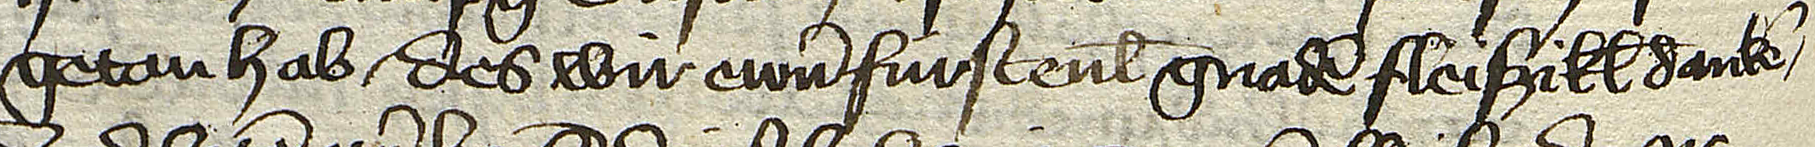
getan hab / des wir ewn* fürſtenl* gnad* fleiſʒikl* danke*
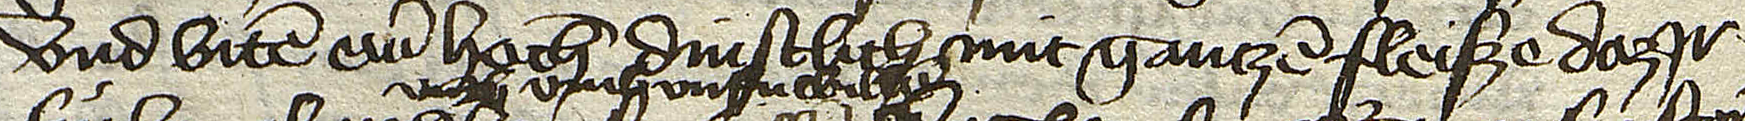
vnd bite* ew* hoch* dinſtlich mit gancʒe* fleiſʒe daʒ Ir
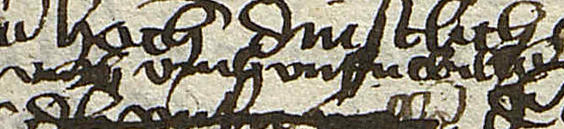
vmb vmb vnſ*n willen
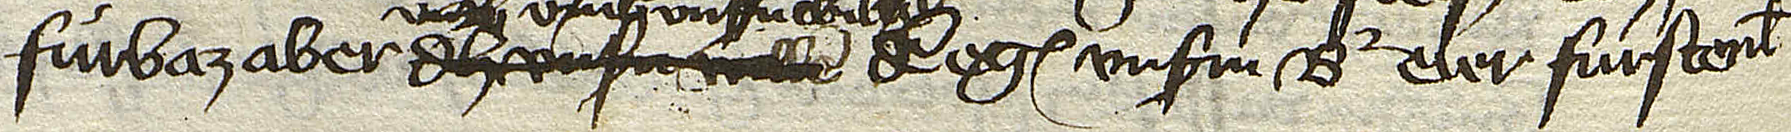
fürbaʒ aber d*h vnſ*m wille d* eg* vnſ*m B* ewr furſtenl*
